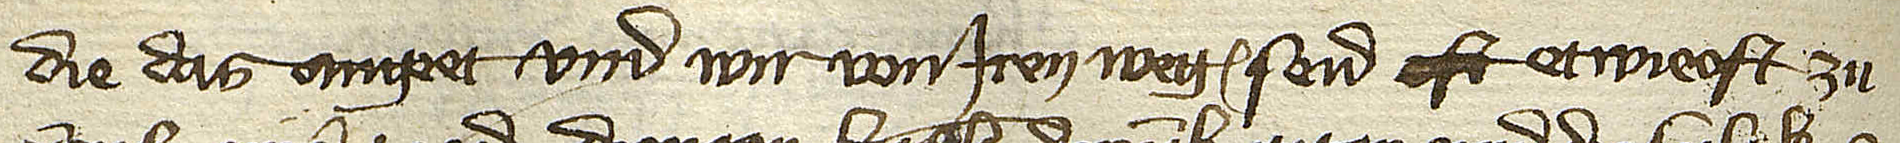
die das angeet vnd wir von Iren weg* ſend oft etwieoft ʒu
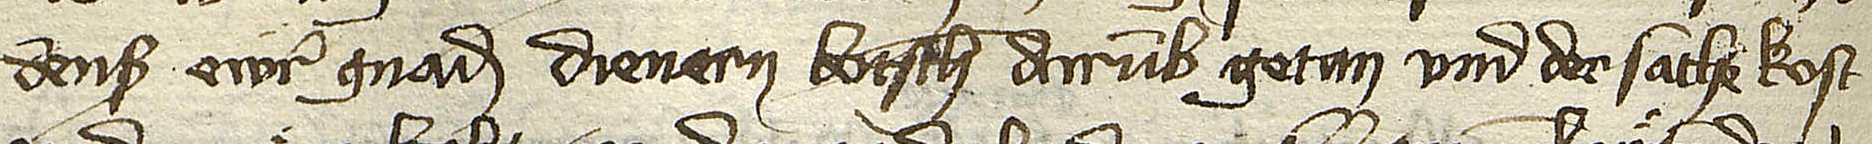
denſ* eẅr* gnad* dienern botſch* darüb getan vnd der ſache koſt
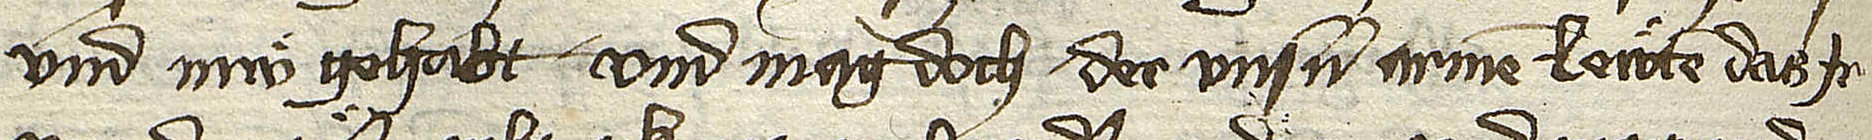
vnd mẅ gehabt / vnd mag doch / der vnſ*n arme* leẅte* dacʒ Ir
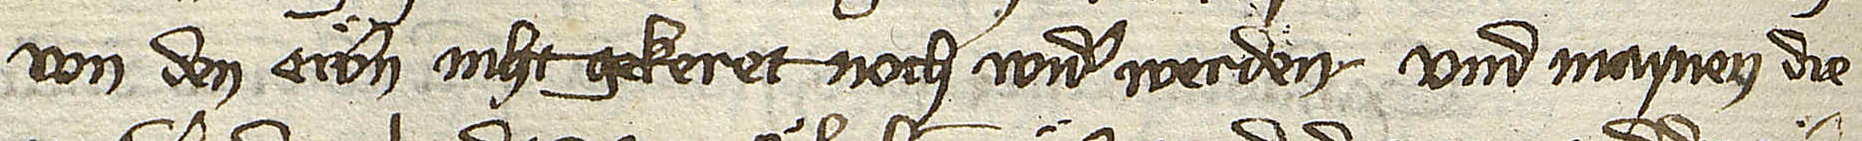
von den eẅ*n niht gekeret noch wid* werden / vnd maynen die
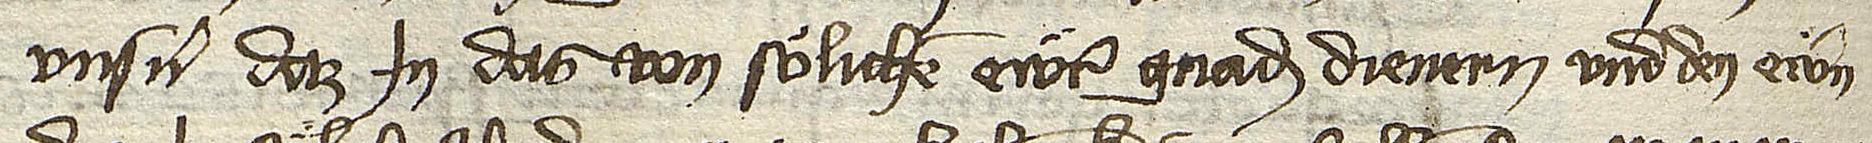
vnſ*n daʒ In das von ſöliche* eẅr* gnad* dienern vnd den eẅ*n
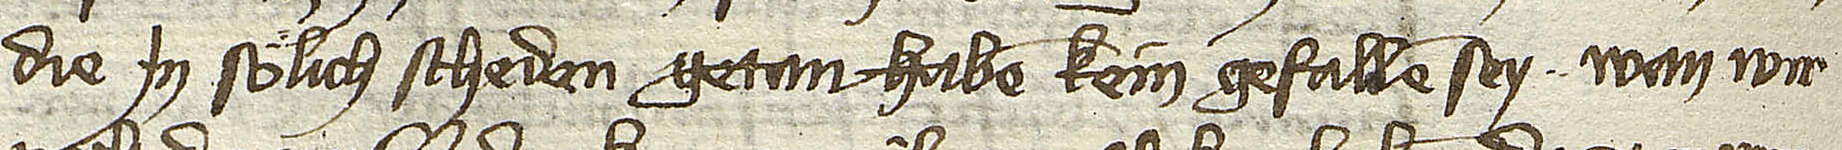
die In ſölich ſcheden getan habe* kein gefalle* ſey ~ wan wir
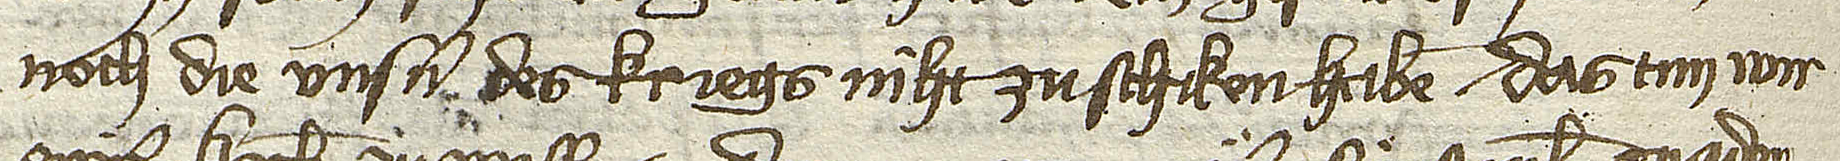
noch die vnſ*n des kriegs niht ʒu ſchiken habe* / das tun wir
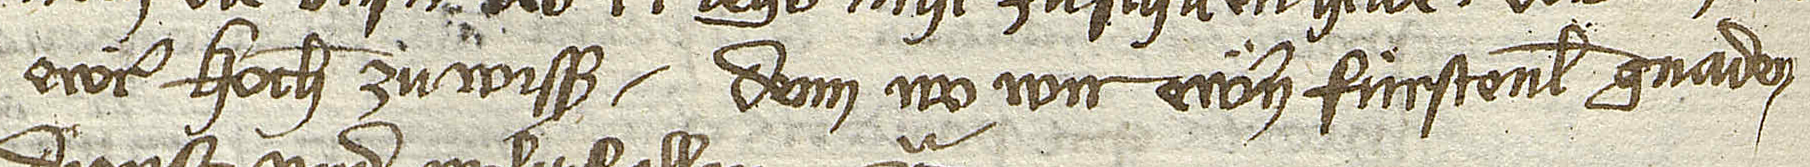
eẅr hoch* ʒu wiſſ* / Denn wo wir eẅ*n fürſtenl* gnaden
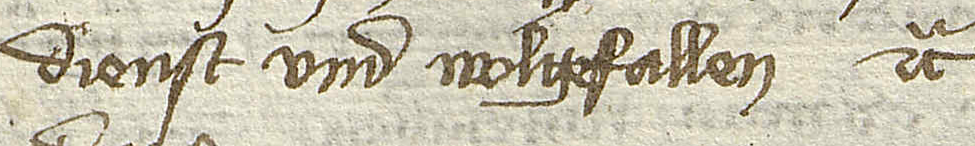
dienſt vnd wolgefallen ec*
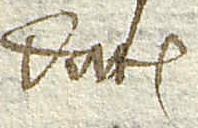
Dat*
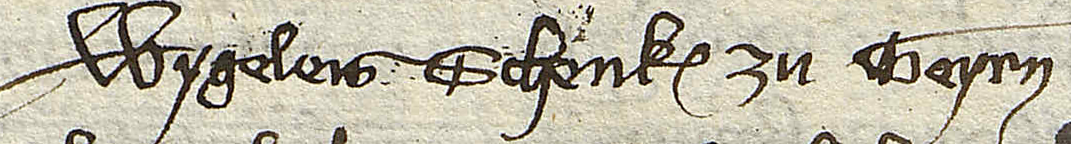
Wygeleis Schenk* ʒu Geyrn
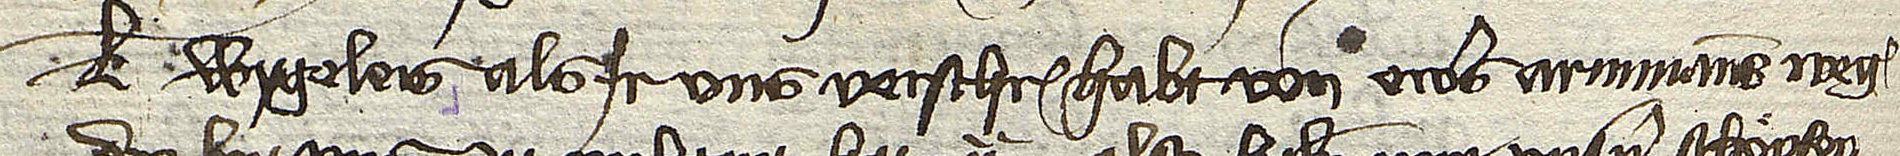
L* Wygeleis als Ir vns verſchr* habt von ew*s armmans* weg*
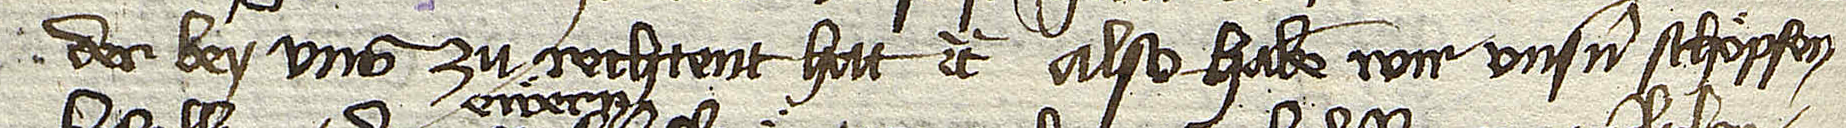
der bey vns ʒu rechtent hat ec* alſo habe* wir vnſ*n ſchöpfen
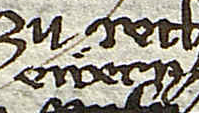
eẅern
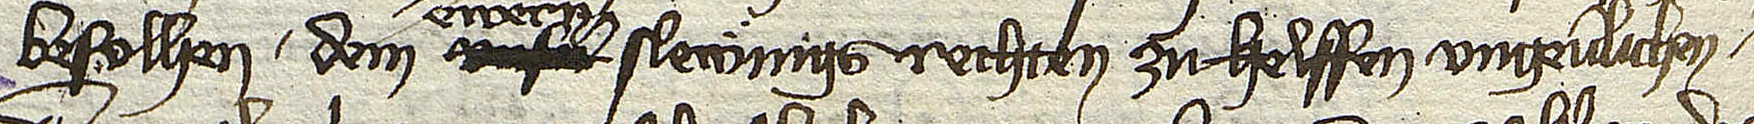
befolhen / dem vnſn* ſleẅnigs rechten ʒu helffen vngeu*lichen /
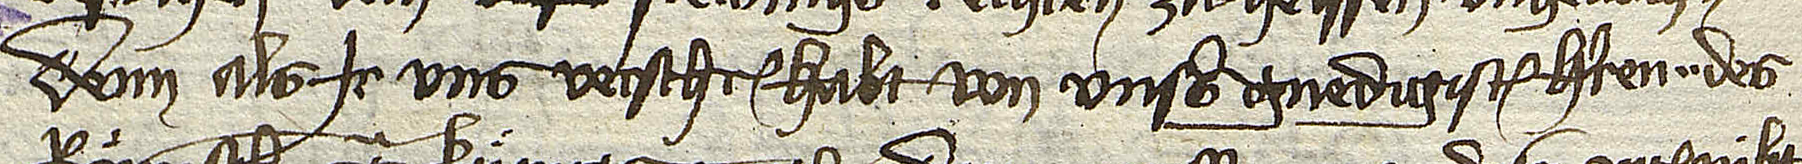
Denn als Ir vns verſchr* habt von vnſ*s gnedigiſt* h*ren ~ des
